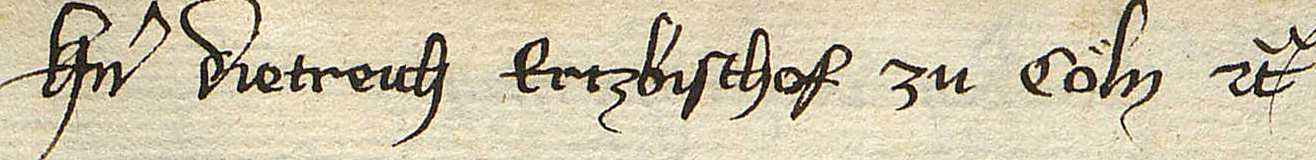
Hn* Dietreich Ercʒbiſchof ʒu Cöln ec*
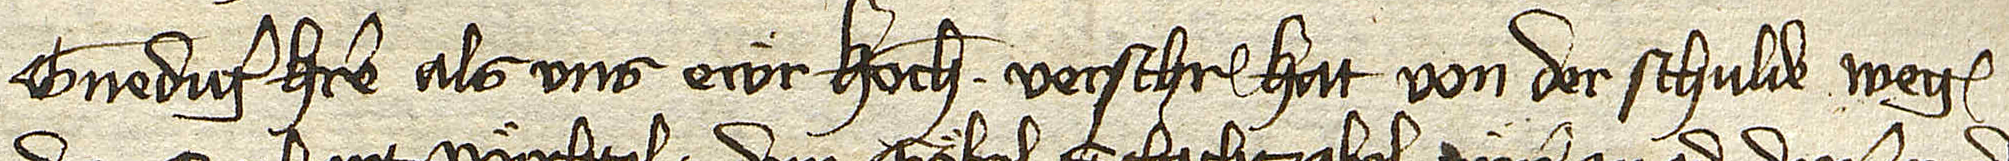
Gnedig* h*re als vns eẅr Hoch* . verſchr* hat von der ſchulde weg*
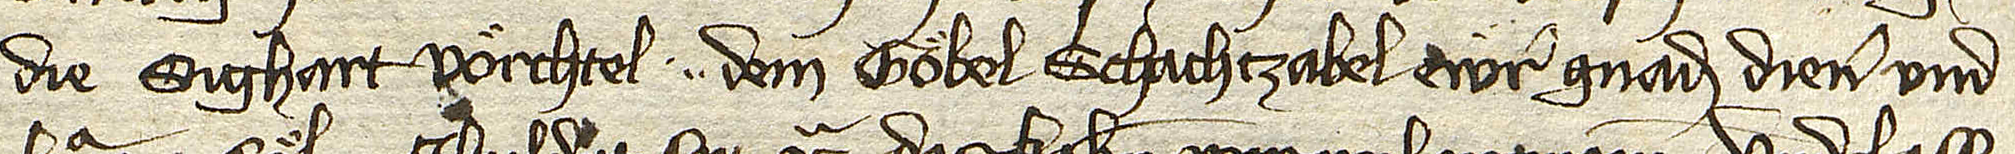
die Sighart Vörchel ~ dem Göbel Schachcʒabel eẅr* gnad* dien* vnd
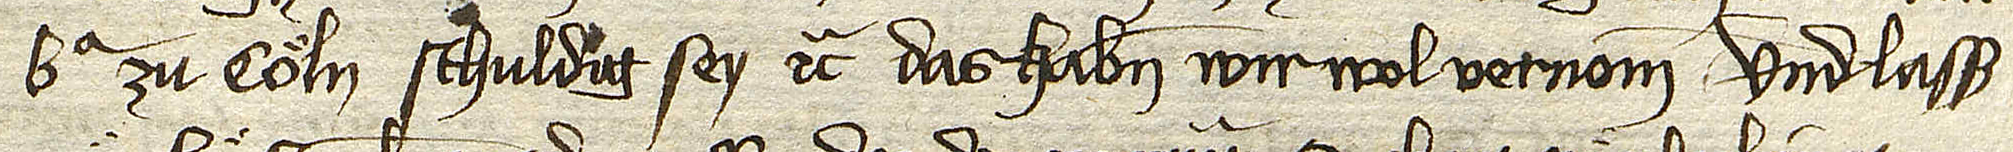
b* ʒu Cöln ſchuldig ſey ec* das habn* wir wol vernom* / Vnd laſſ*
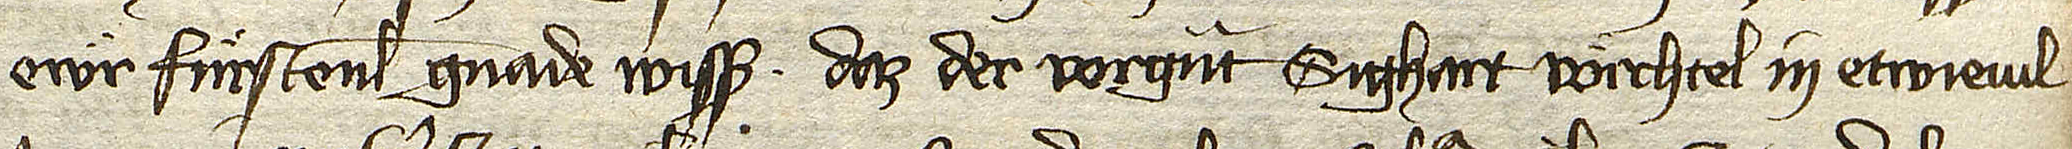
eẅr fürſtenl* gnade wiſſ* . daʒ der vorgnt* Sighart vörchtel in etwieuil
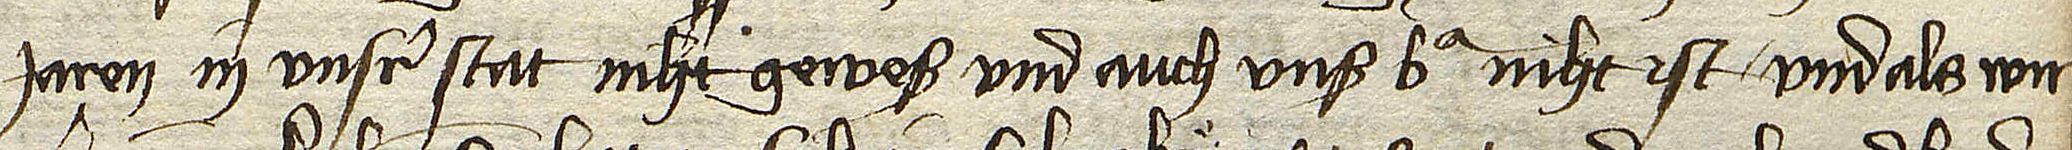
Iaren in vnſr* ſtat niht geweſ* vnd auch vnſ* b* niht iſt / vnd als wir
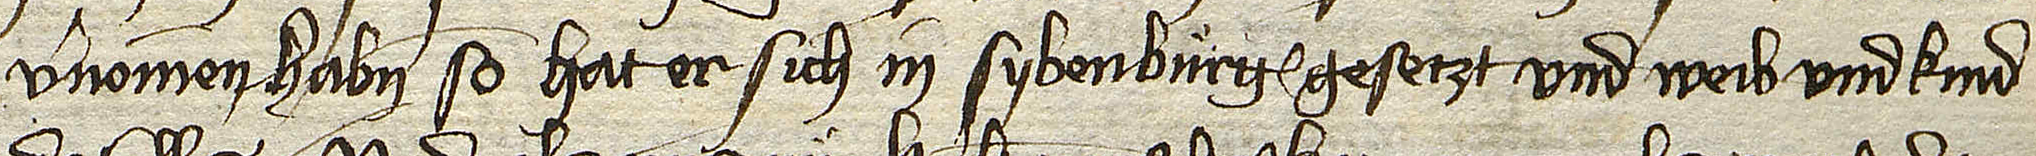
v*nom*en habn* ſo hat er ſich in ſybenbürg* geſecʒt vnd weib vnd kind
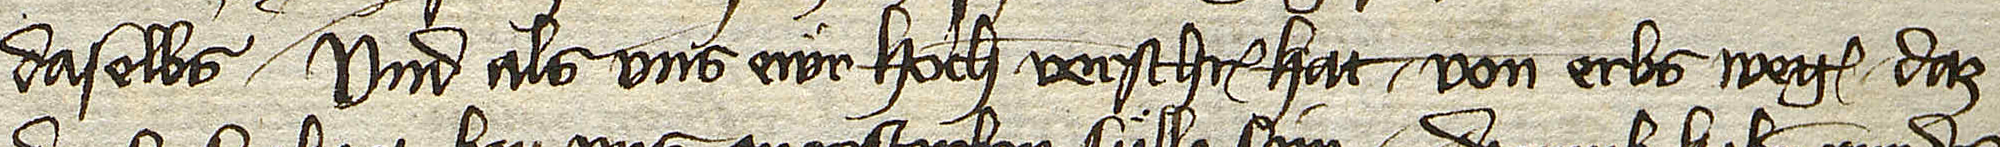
daſelbs / Vnd als vns eẅr hoch* verſchr* hat / von erbs weg* / daʒ
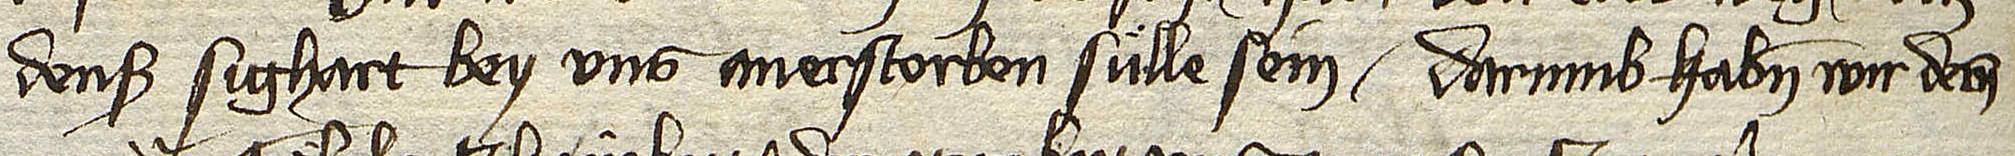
denſ* ſighart bey vns anerſtorben ſülle ſein / Darumb habn* wir des
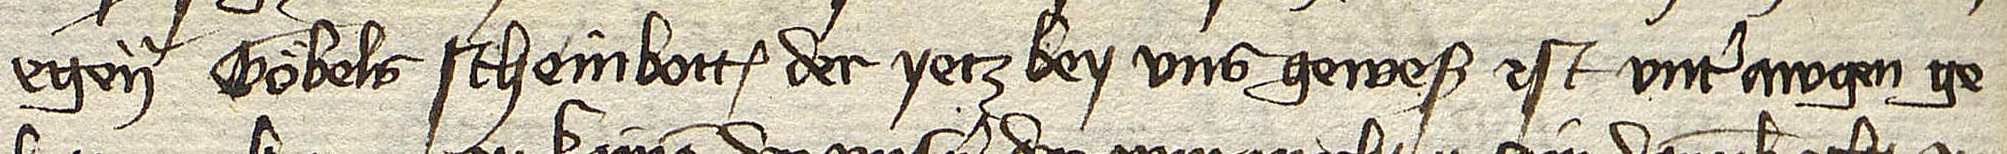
egen* Göbels ſcheinbott* der yecʒ bey vns geweſ* iſt vnt*awgen ge
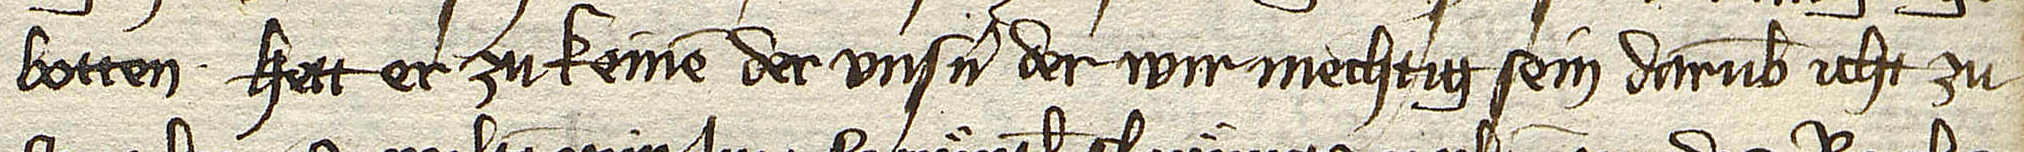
botten . hett er ʒu keine* der vnſn* der wir mechtig ſein darub* icht ʒu
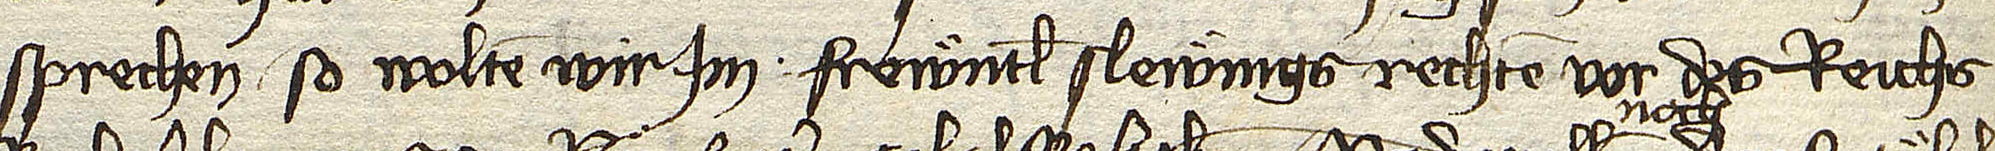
ſprechen / ſo wolte* wir Im . freẅntl* ſleẅnigs rechte* vor des Reichs
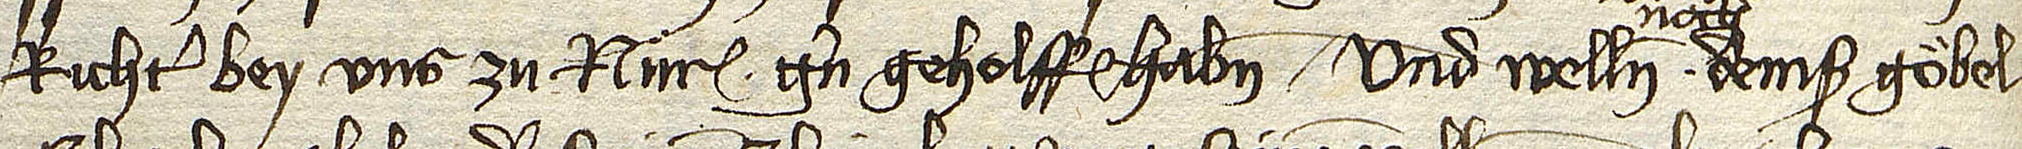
Richt* bey vns ʒu Nür* . g*n geholff* habn* / Vnd welln* . demſ* göbel
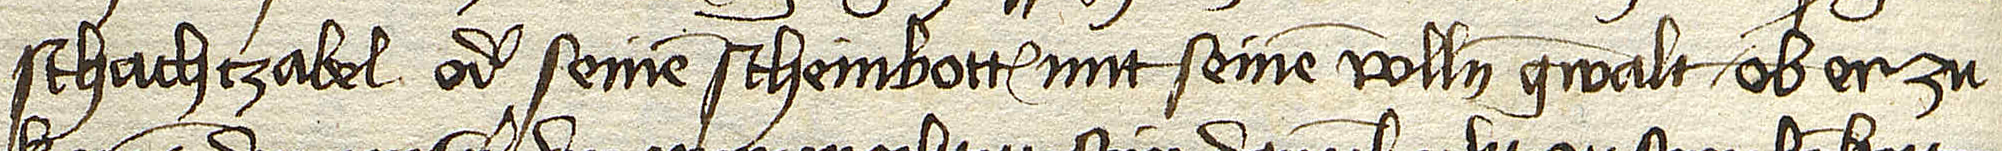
ſchachcʒabel od* ſeine* ſcheinbott* mit ſeine* volln* gwalt / ob er ʒu
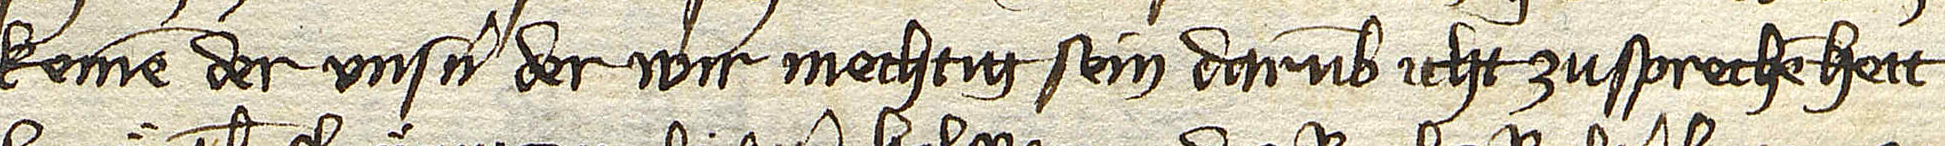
keine* der vnſn* der wir mechtig ſein darub* icht ʒuſpreche* hett
